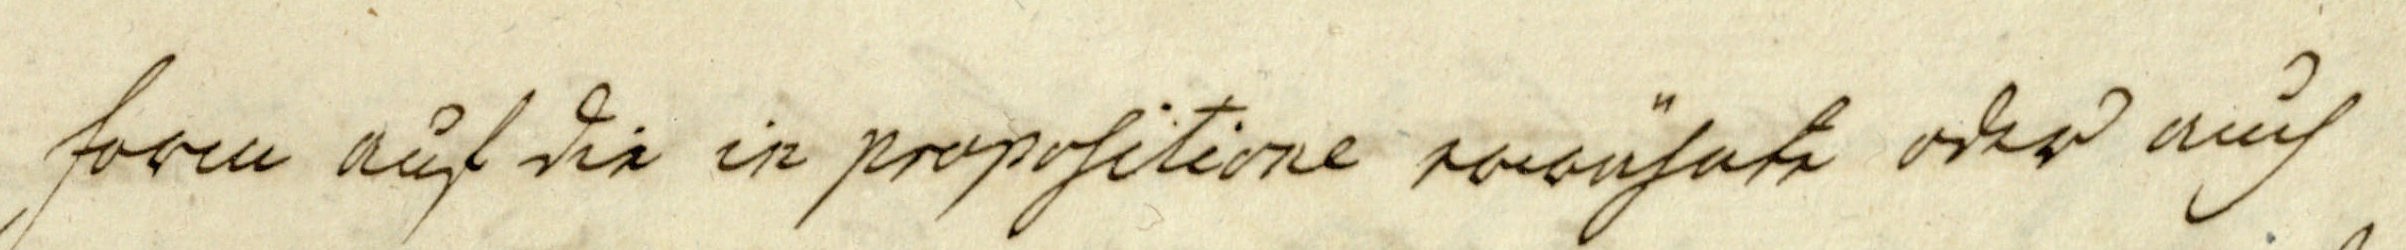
Form auf die in propositione erwähnte oder auch
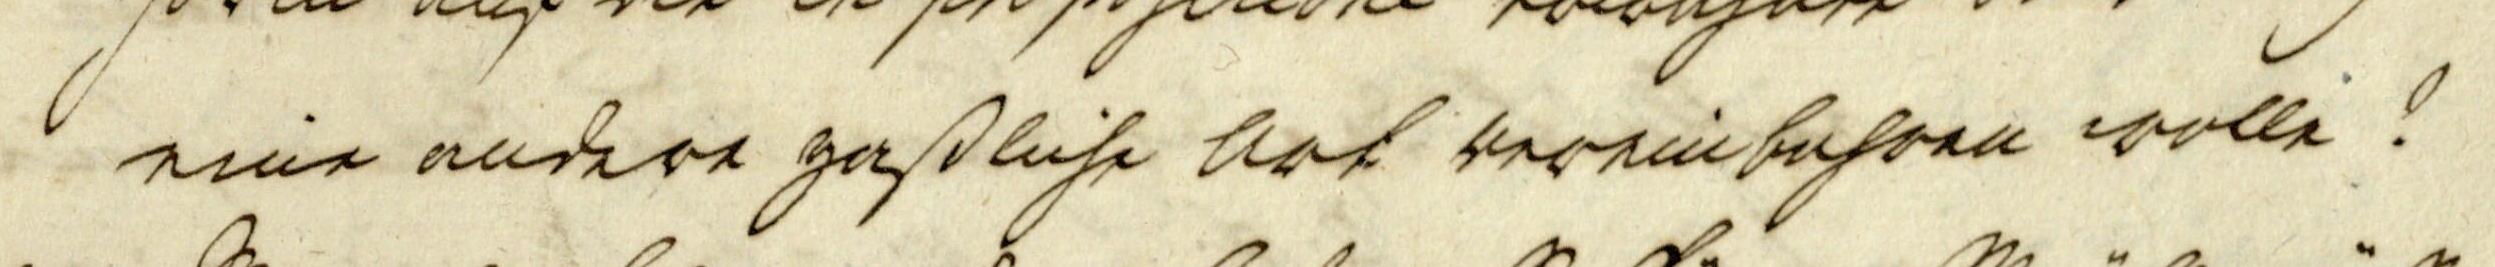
eine andere paßliche Art vereinbahren wolle!
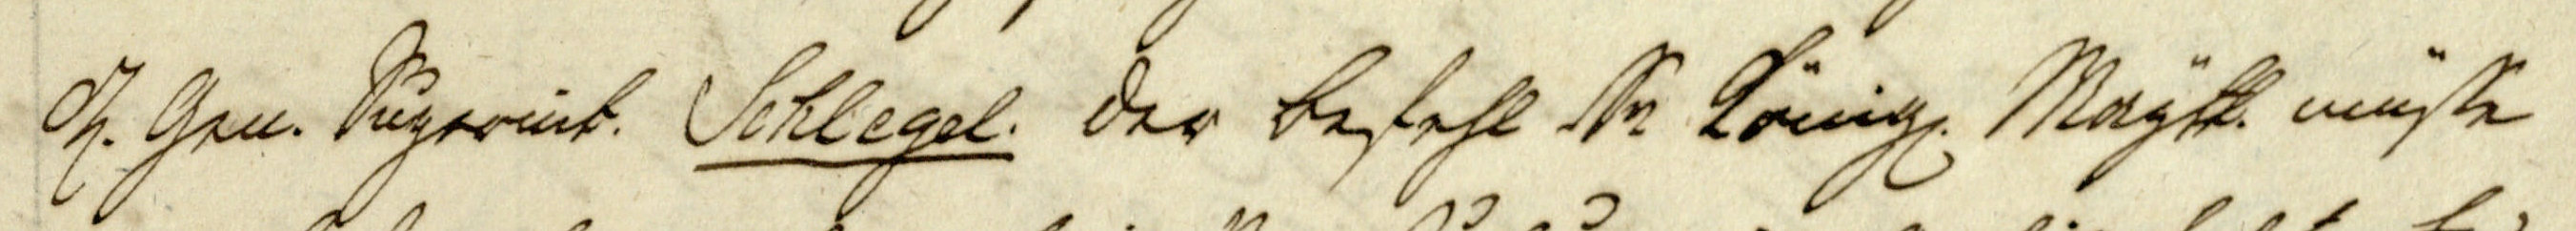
dh. Gen. Superint. Schlegel. der Befehl Sr. Königl. Maÿtt. müsse
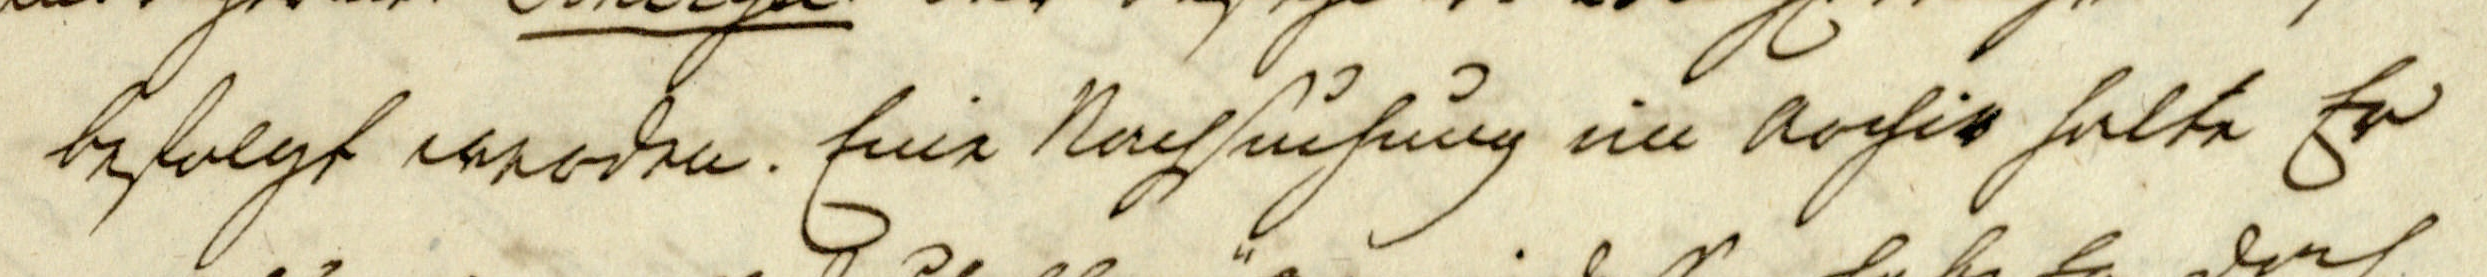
befolgt werden. Eine Nachsuchung im Archiv halte Er
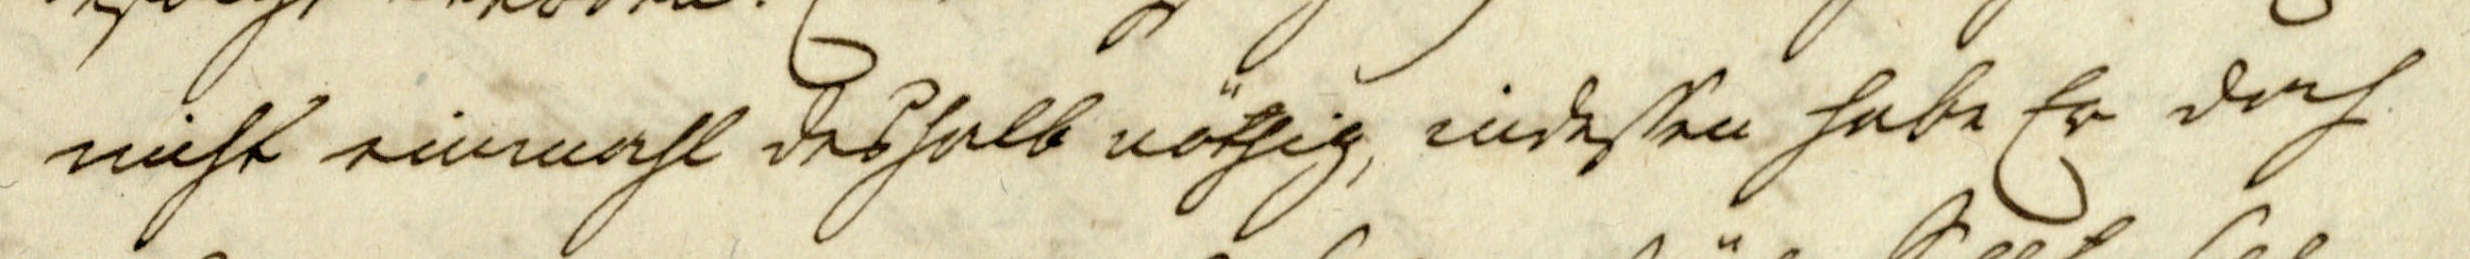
nicht einmahl deshalb nöthig, indessen habe Er doch
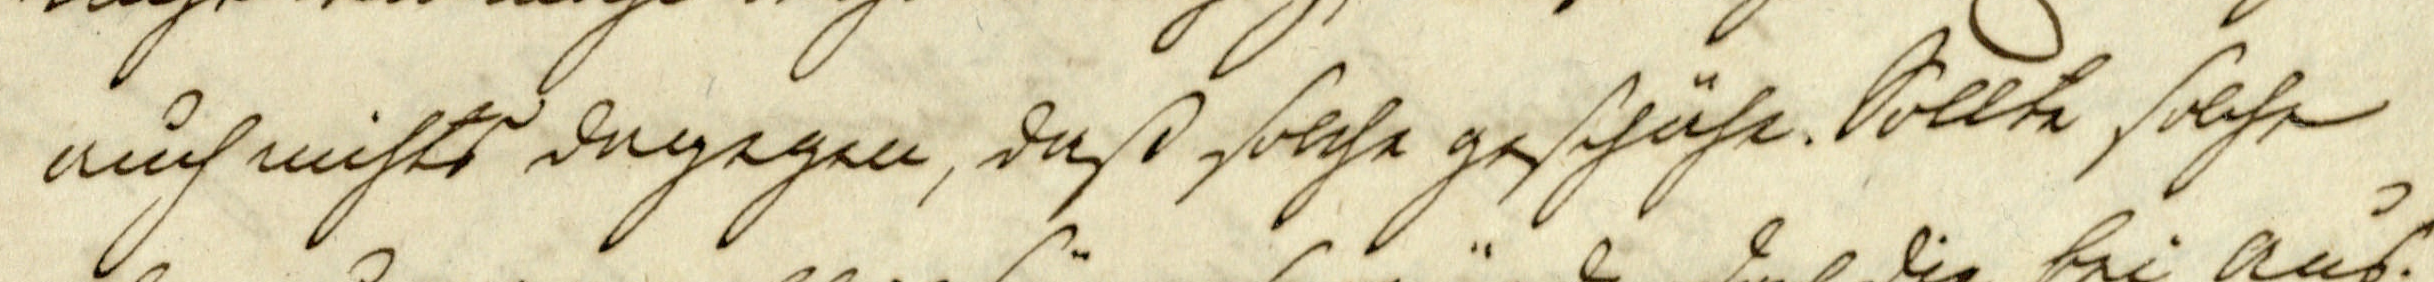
auch nichts dagegen, daß solche geschähe. Sollte solche
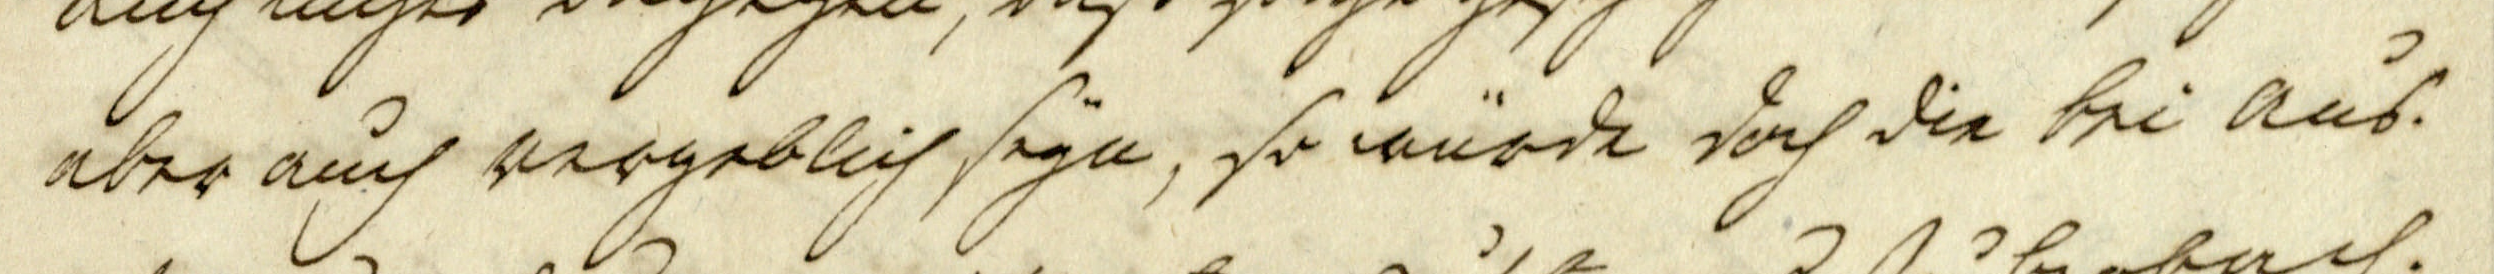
aber auch vergeblich seÿn, so würde doch die bei Aus¬
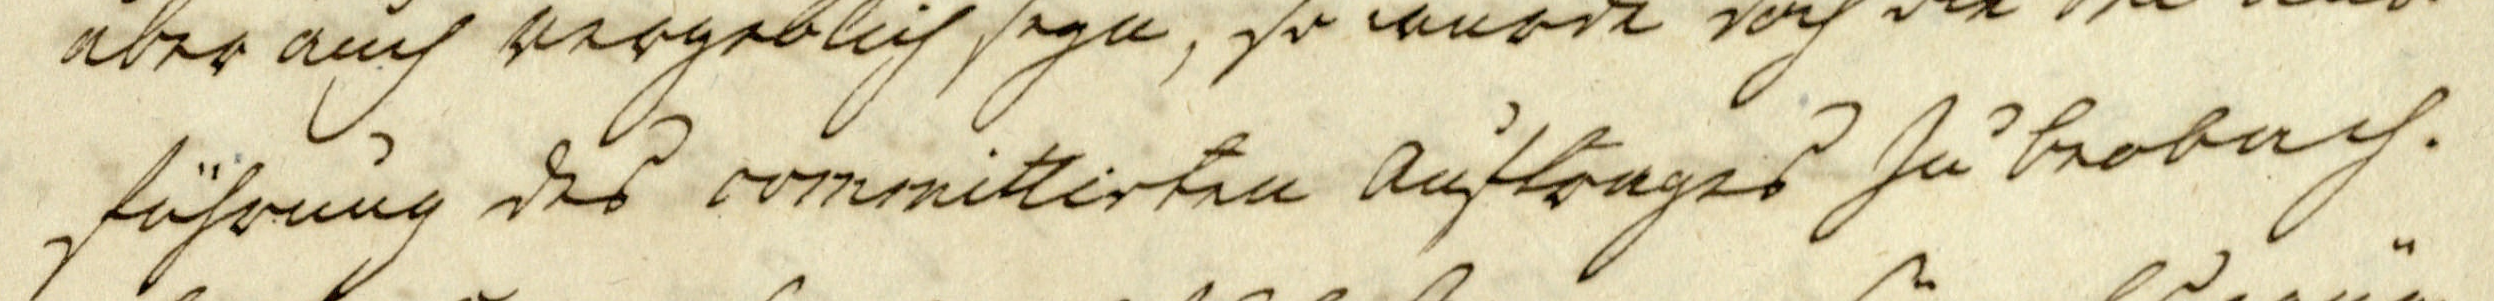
führung des committirten Auftrages zu beobach¬
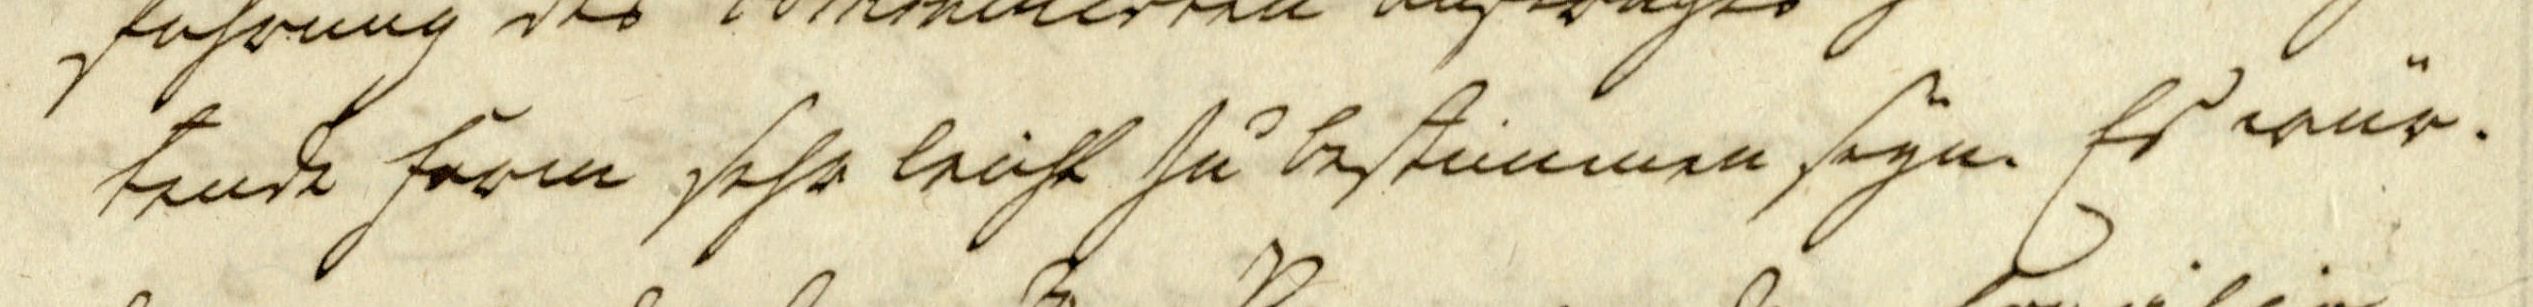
tende Form sehr leicht zu bestimmen seÿn. Es wür¬
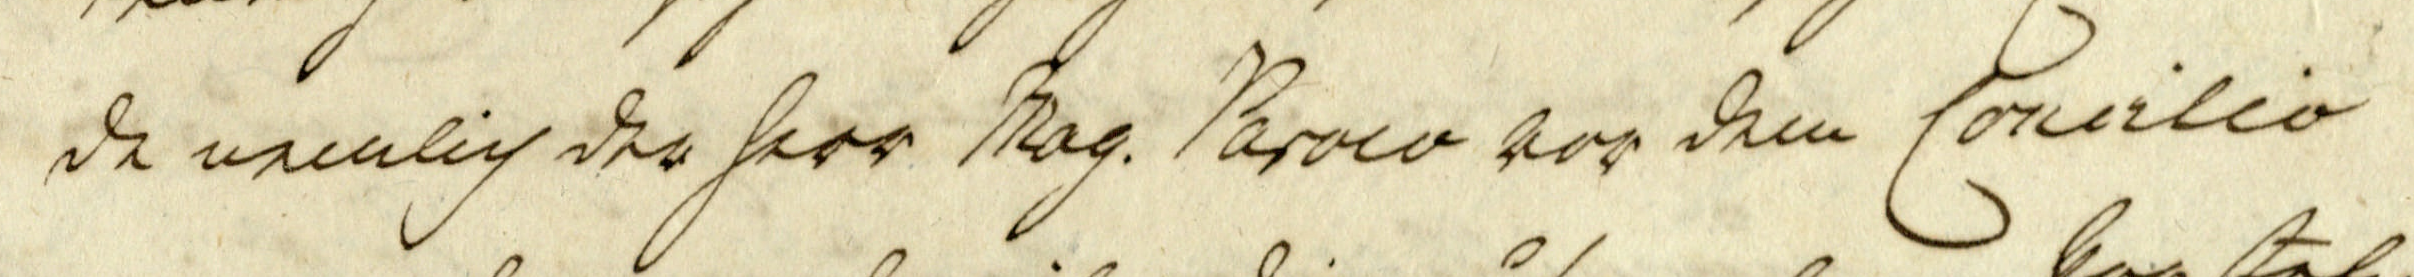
de nemlich der herr Mag. Parow vor dem Concilio
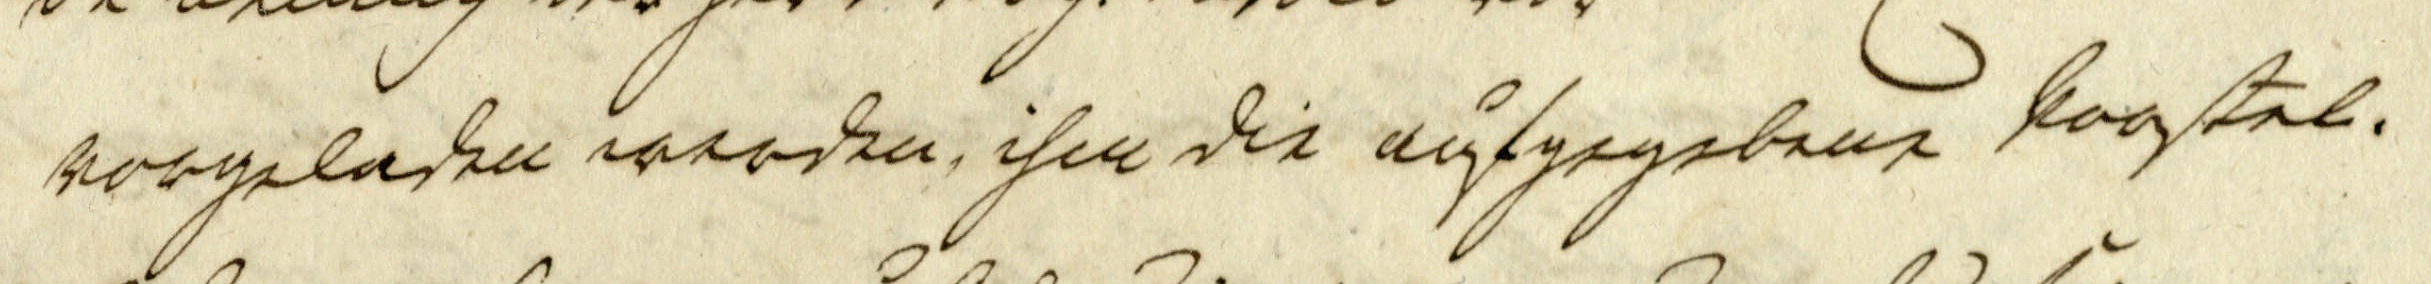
vorgeladen werden, ihm die aufgegebene Vorstel¬
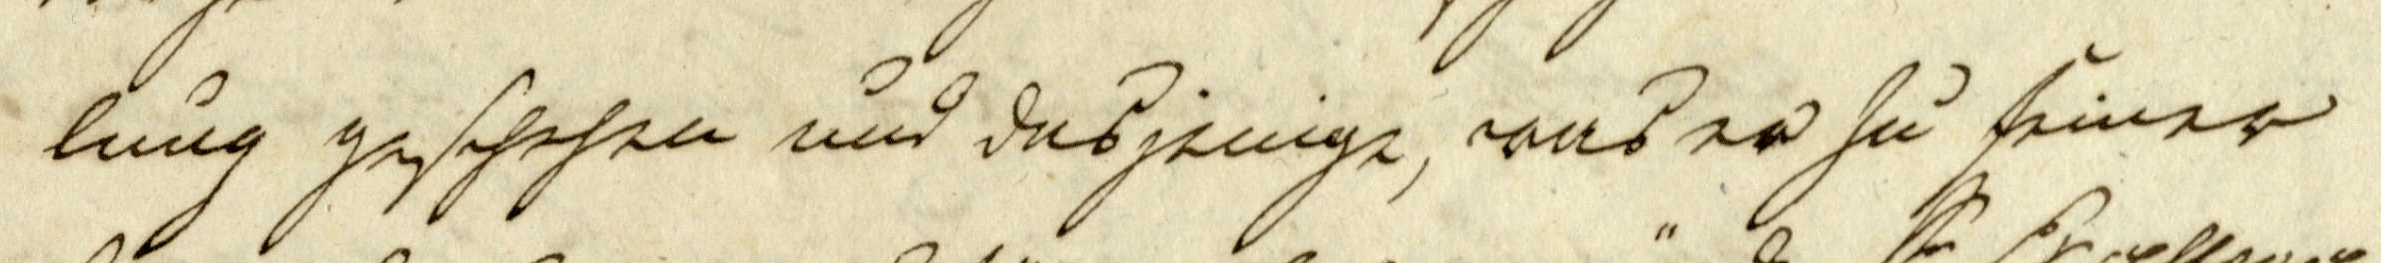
lung geschehen und dasjenige, was er zu seiner
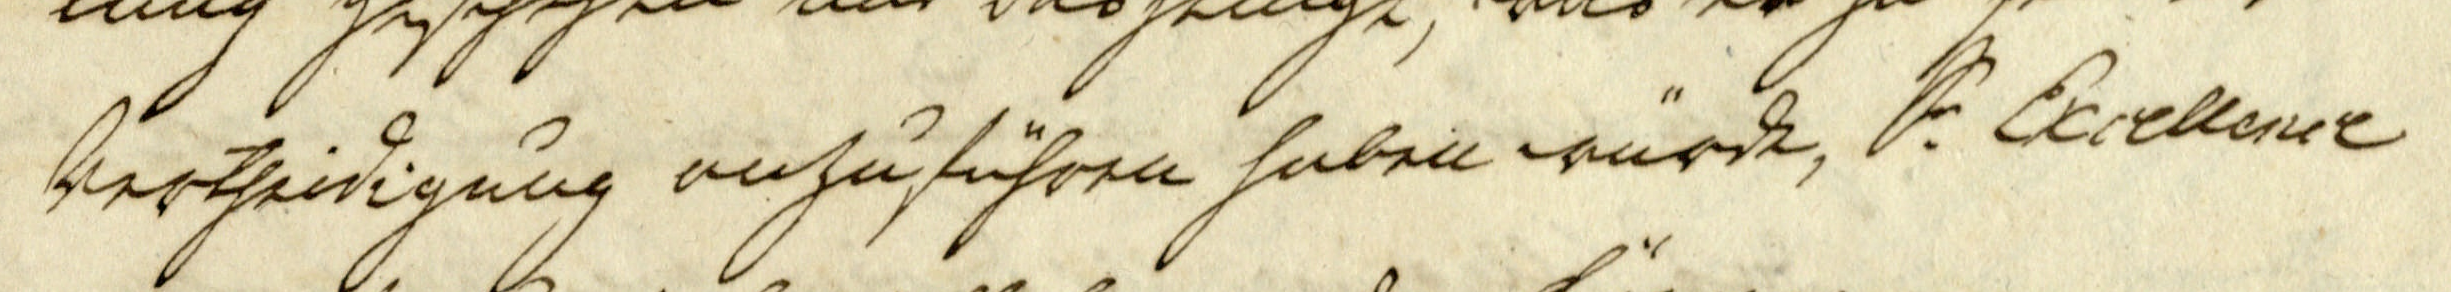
Vertheidigung anzuführen haben würde, Sr. Excellence
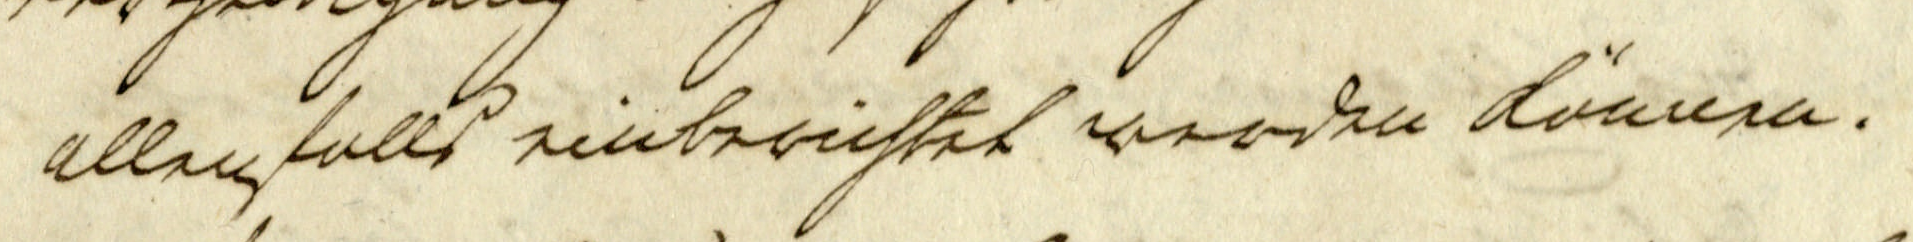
allenfalls einberichtet werden können.
